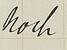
Röder
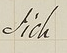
sich
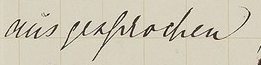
ausgesprochen; der
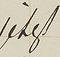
letztere
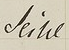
als seine
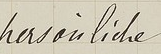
persönliche
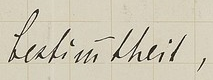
Bestimmtheit,
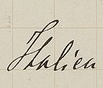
Italien
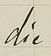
die
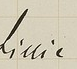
Linie
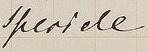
Weiteres hat
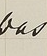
er sich
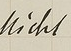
nicht
